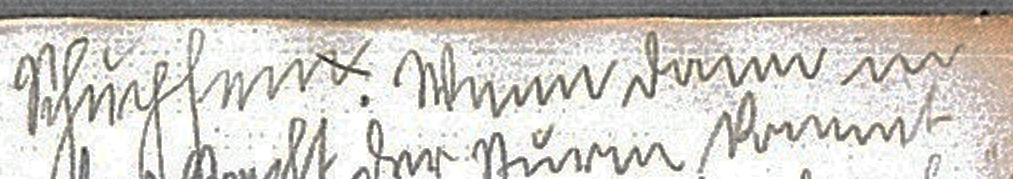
Schupfen. Wenn dann in
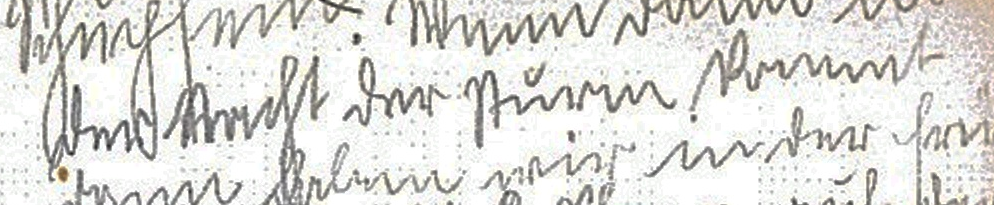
der Nacht der Sturm kommt
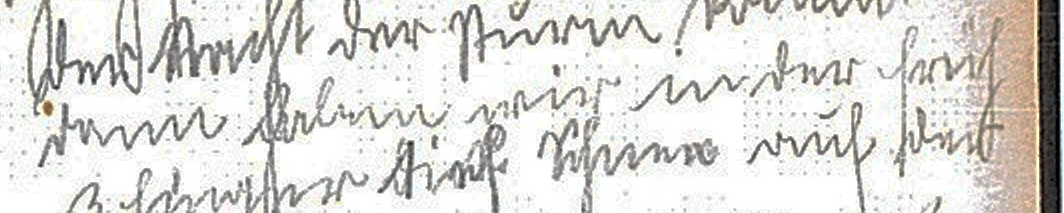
dann haben wir in der früh
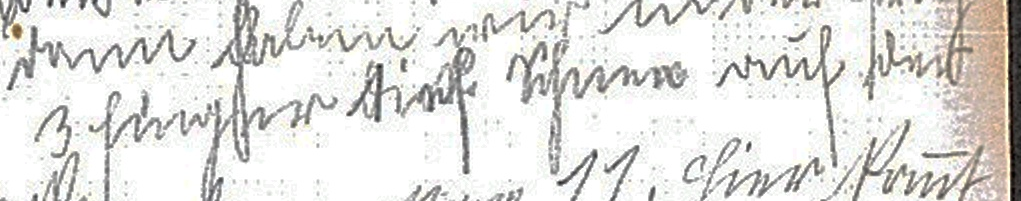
3 finger tief Schnee auf der
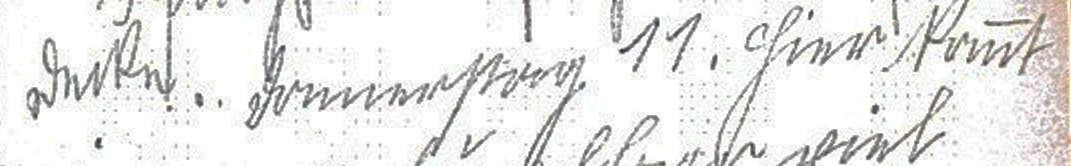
Decke. Donenrstag 11. Hier kommt
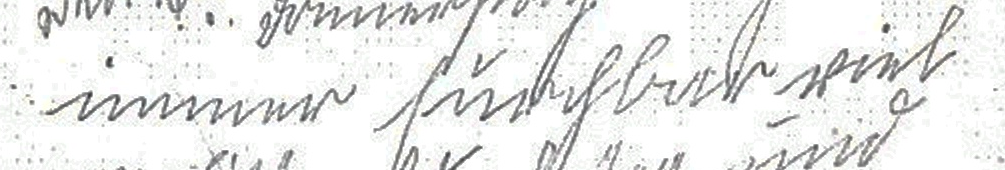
immer furchtbar viel
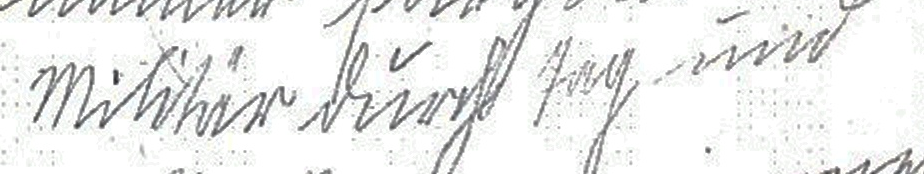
Militär durch Tag und
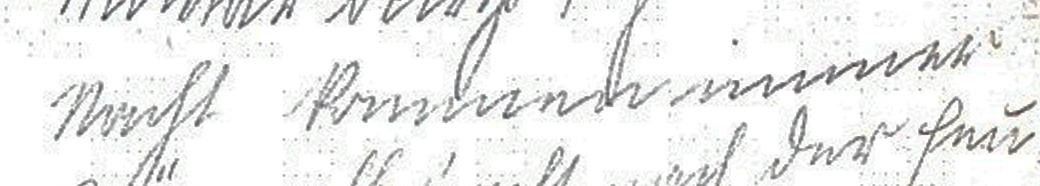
Nacht kommen immer
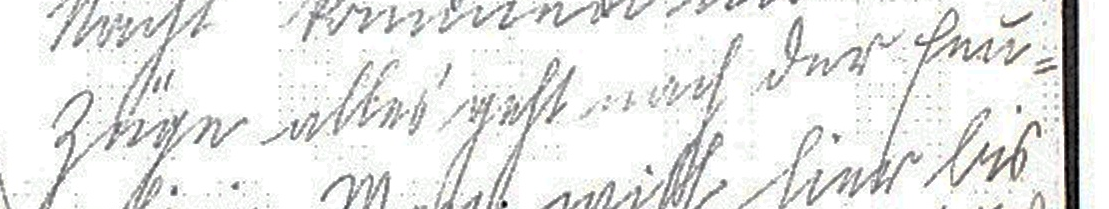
Züge alles geht nach der Feu-
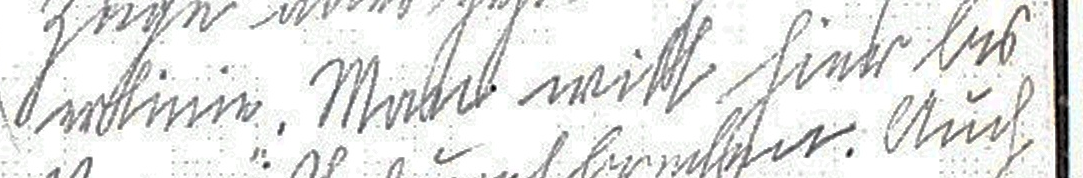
erlinie. Man will hier bis
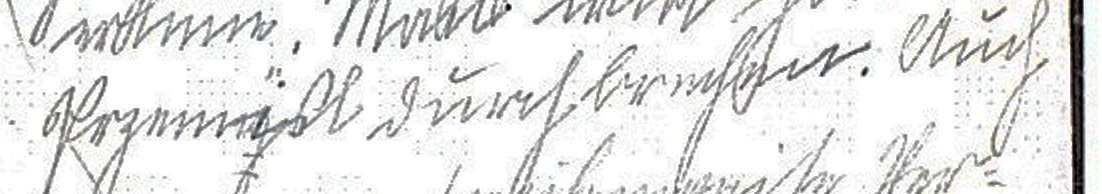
Prezemisl durchbrechen. Auch
